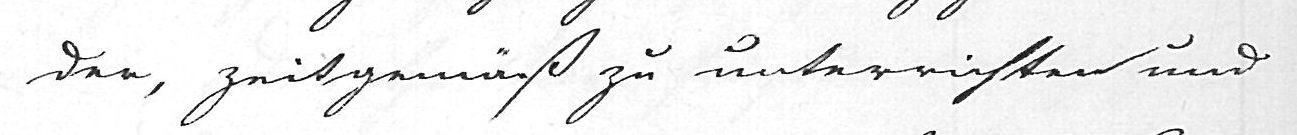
der, zeitgemäß zu unterrichten und
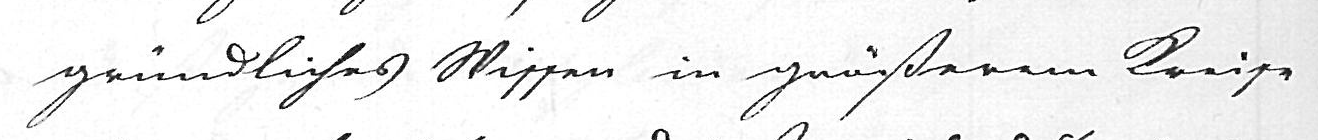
gründliches Wissen in größerem Kreise
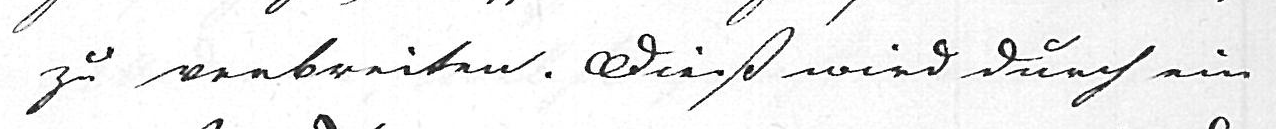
zu verbreiten. Dieß wird durch ein
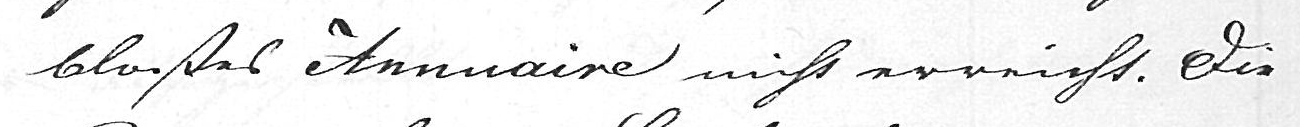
bloße Annuaire nicht erreicht. Die
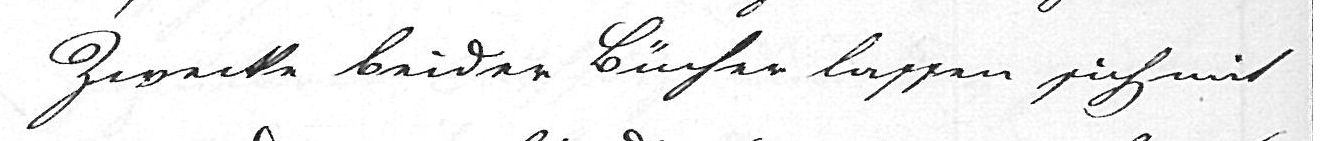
Zwecke beiden Bücher lassen sich mit
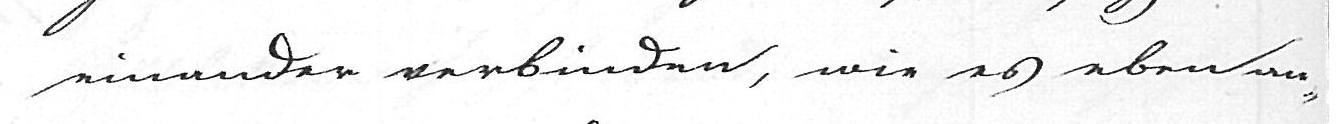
einander verbinden, wie es eben an-
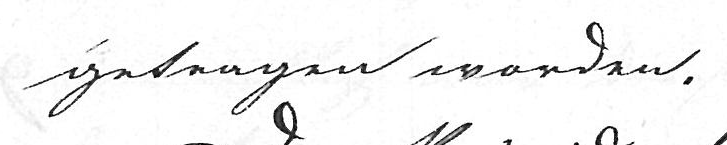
getragen worden.
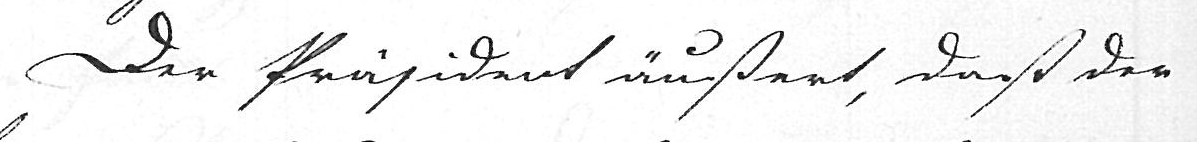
Der Präsident äußert, daß der
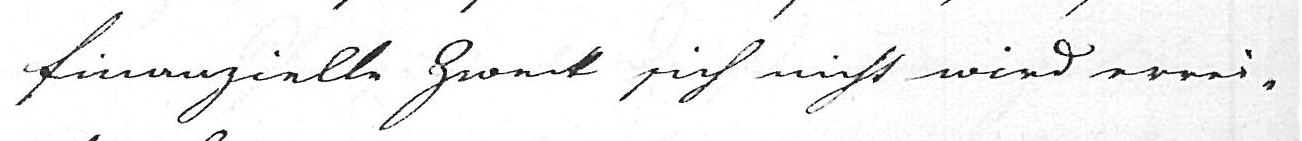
finanzielle Zweck sich nicht wird errei-
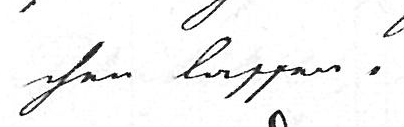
chen lassen.
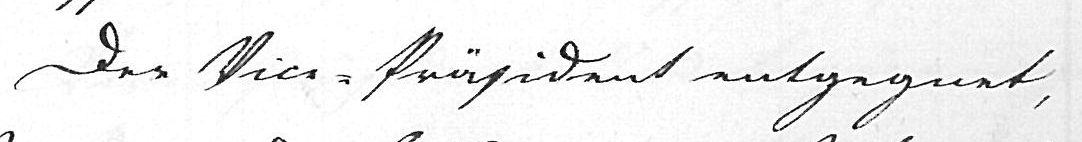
Der Vice-Präsident entgegnet,
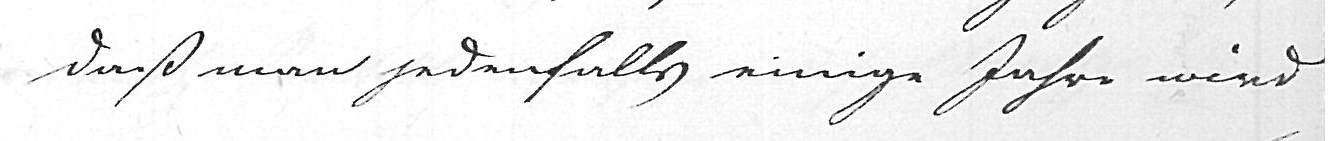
daß man jedenfalls einiges Jahre wird
